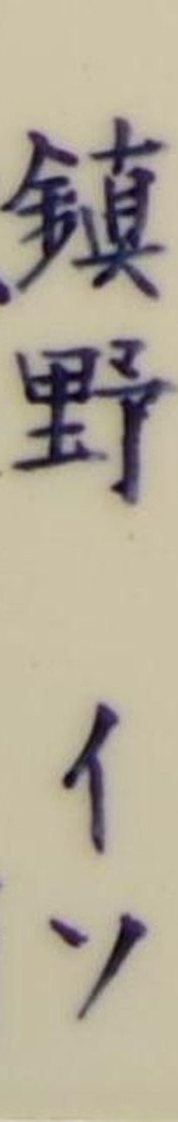鎮野イソ

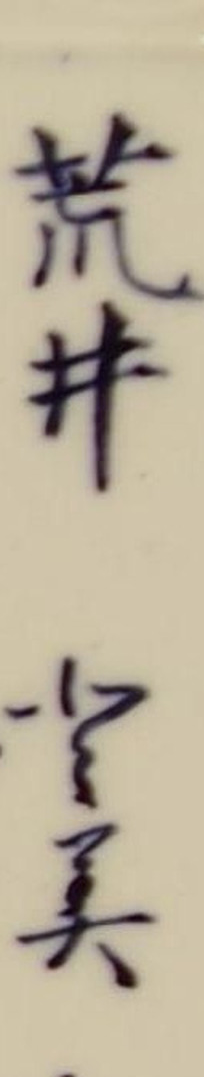荒井と美
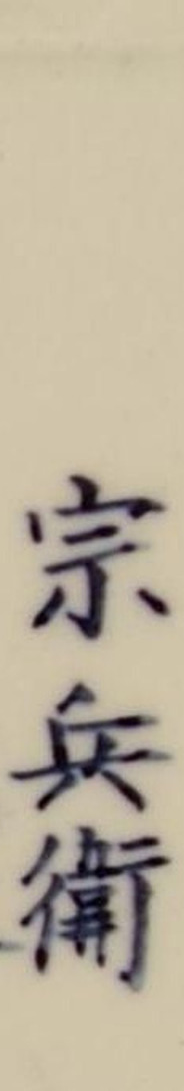宗兵衛
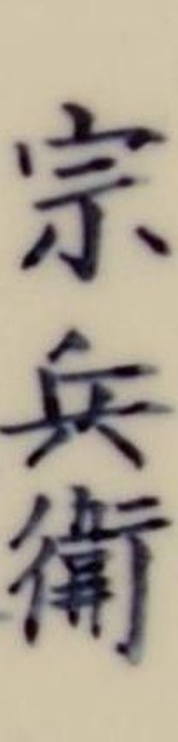宗兵衛
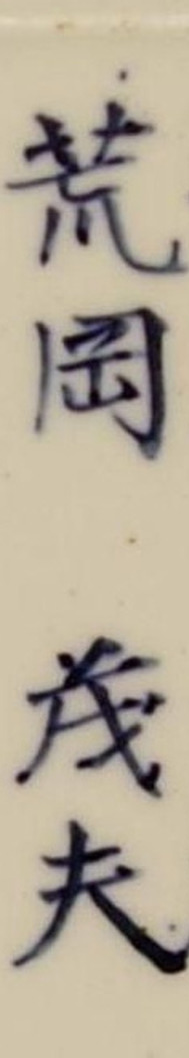荒岡茂夫
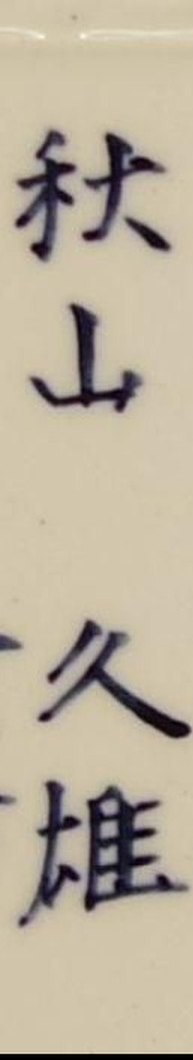秋山久雄
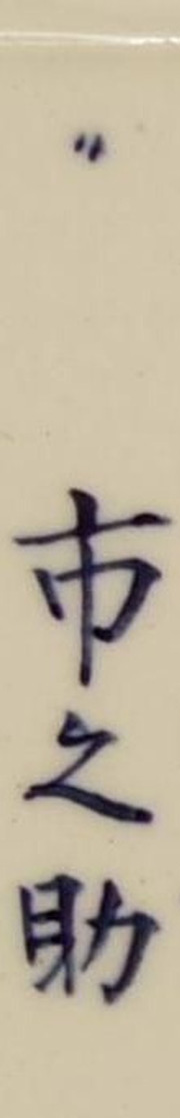市之助
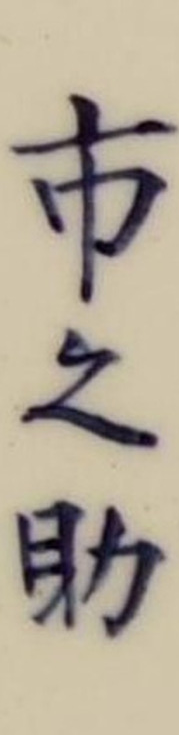市之助
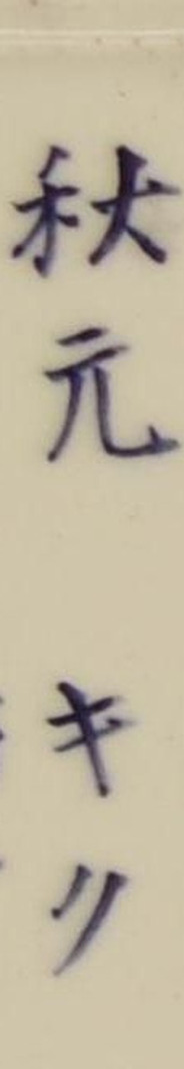秋元キク

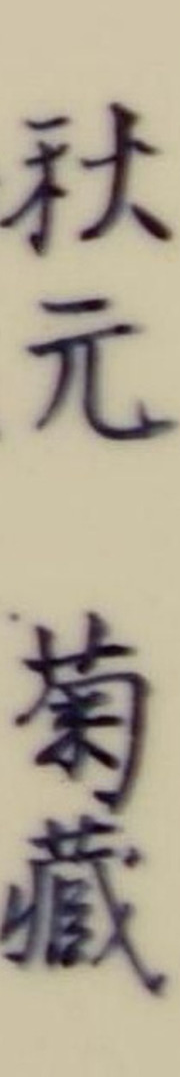秋元菊蔵
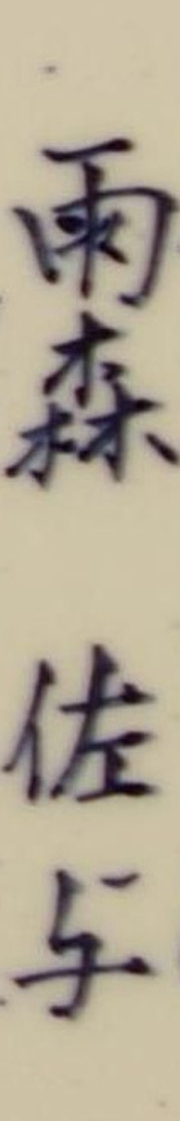南森佐与
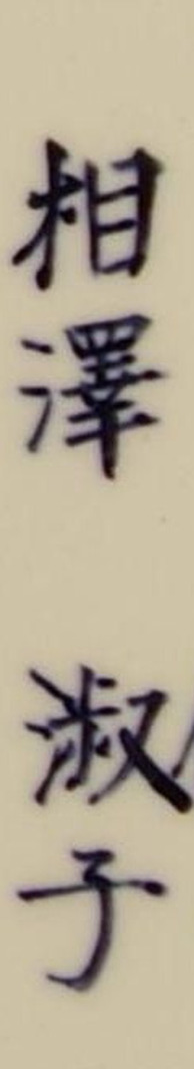相澤淑子
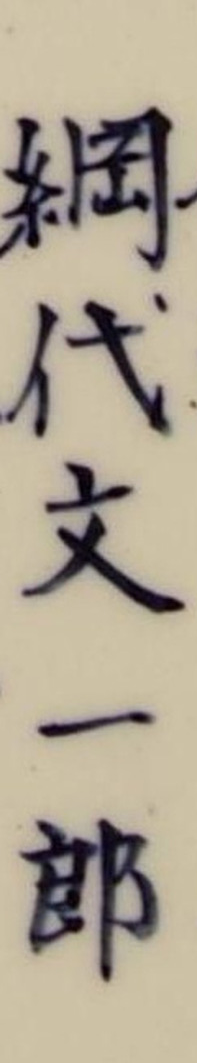綱代文一郎
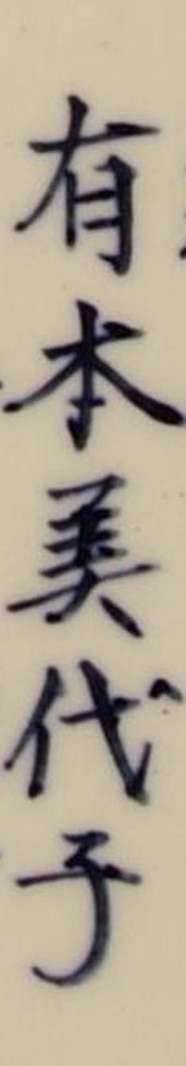有本美代子
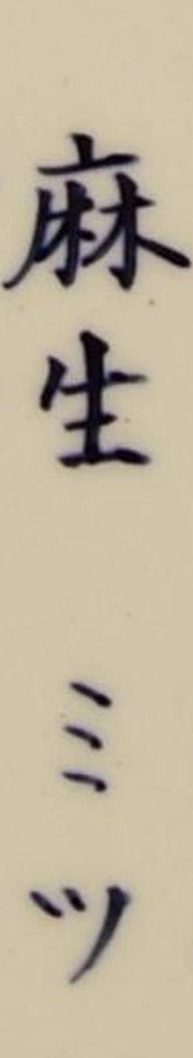麻生ミツ
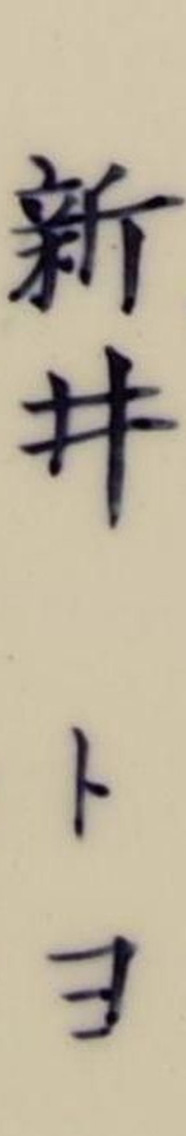新井トヨ
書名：E~L
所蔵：高野山金剛峯寺
